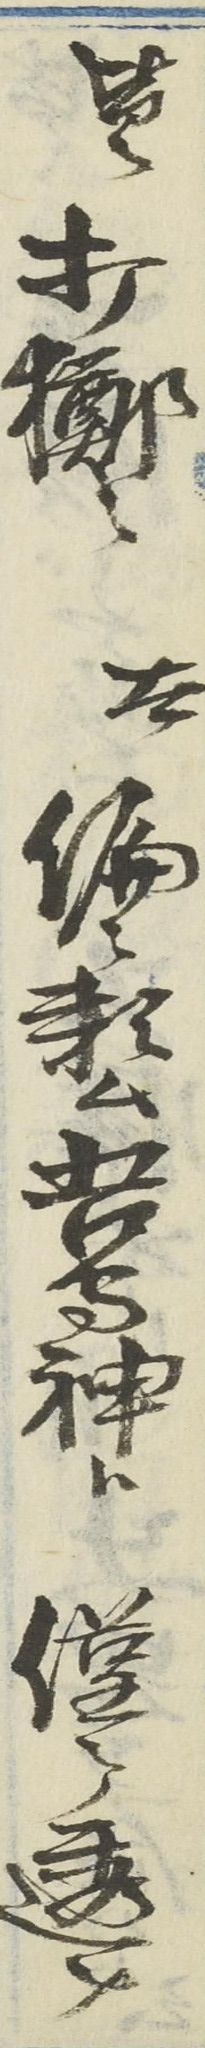皆々打擲之太偏ニ頼ム吾守神ト僅之透ヲ
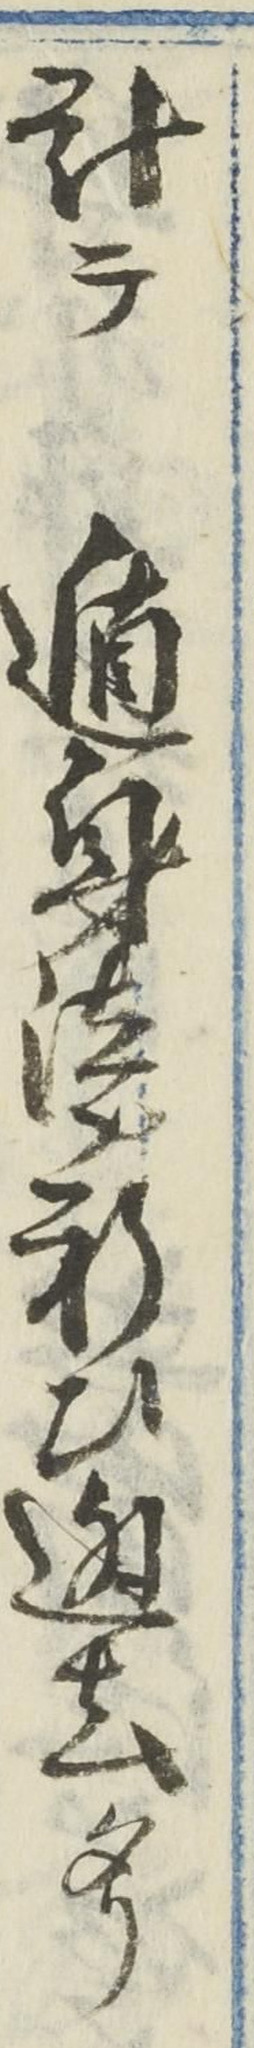計テ遁身法ヲ行ひ逃去タリ
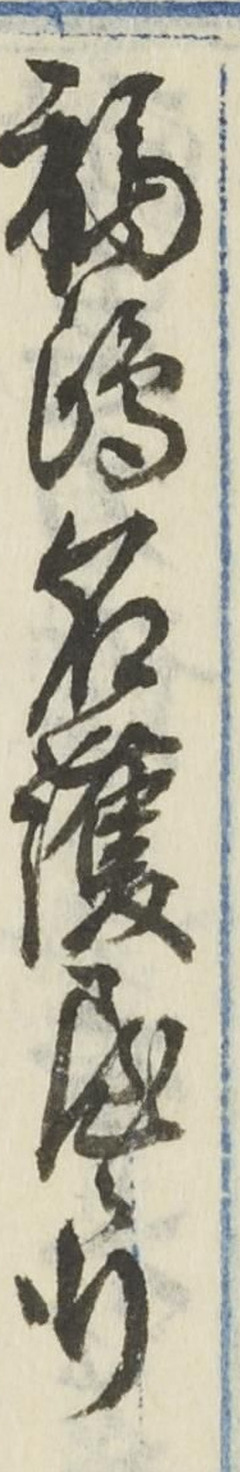福島名護屋ニ行
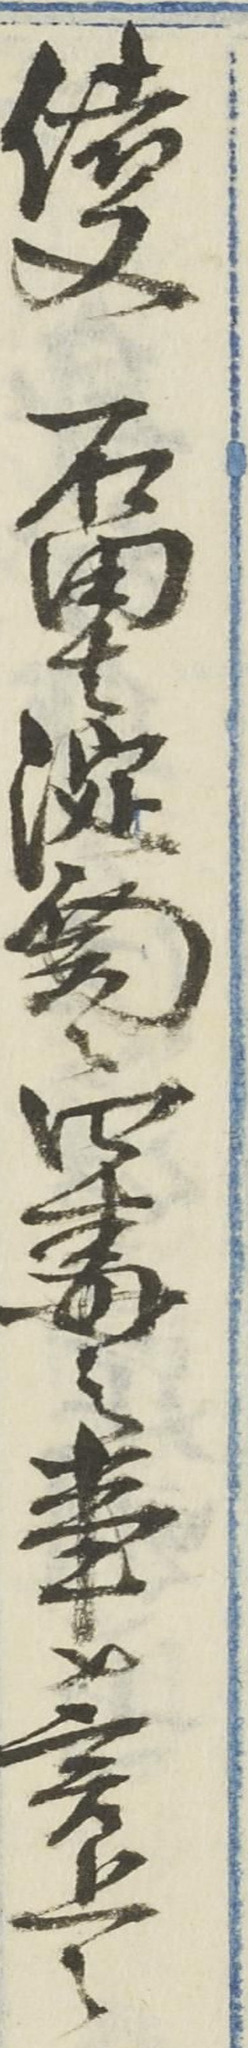偖又石田ハ淀殿ニ四毒之事ヲ言上之
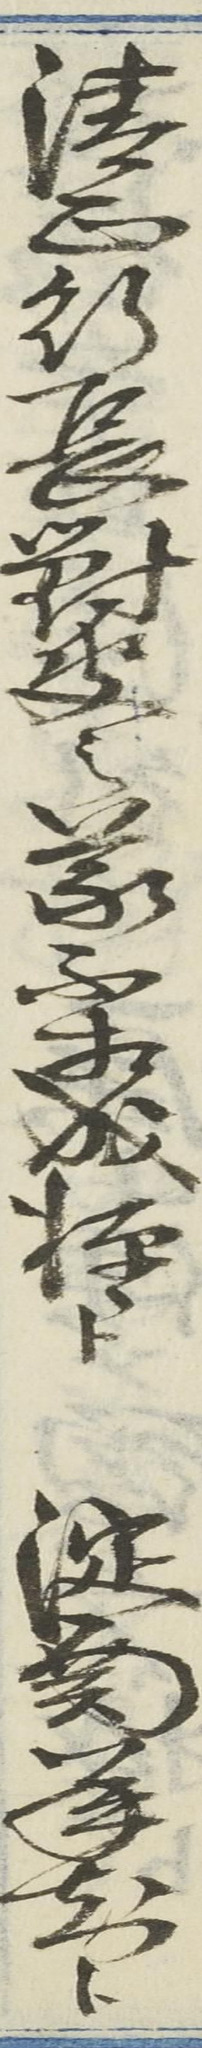清正行長対決之義不相成様二ト淀殿承知ト
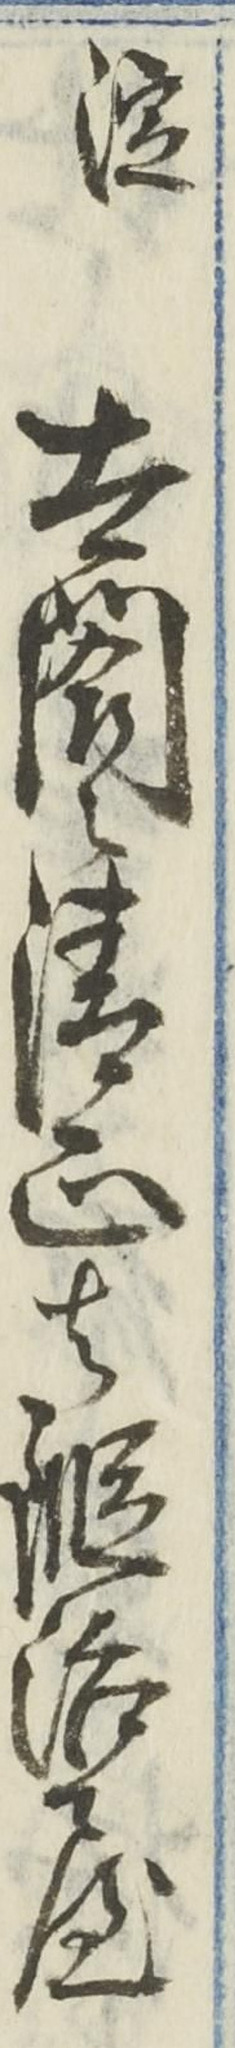淀太閤ニ清正ハ鍛冶屋
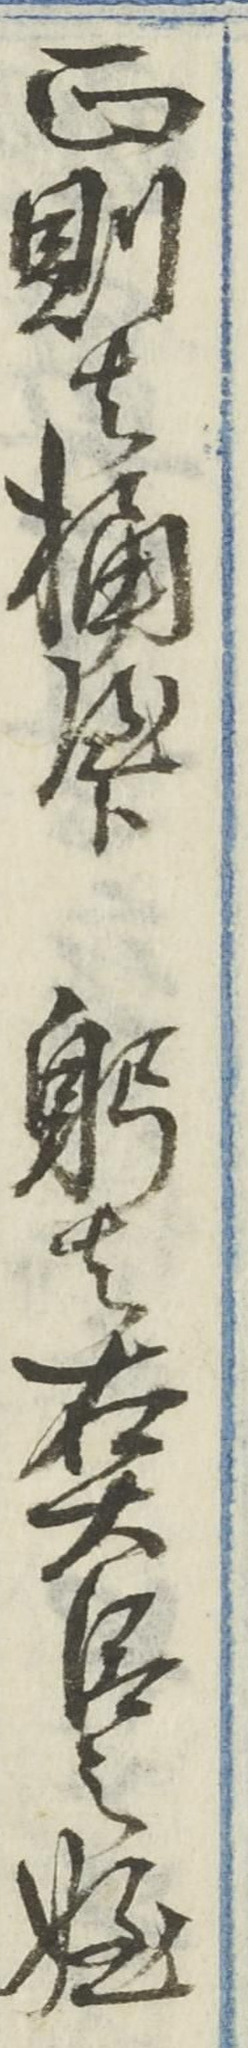正則ハ桶屋ト躬ハ右大臣之姪
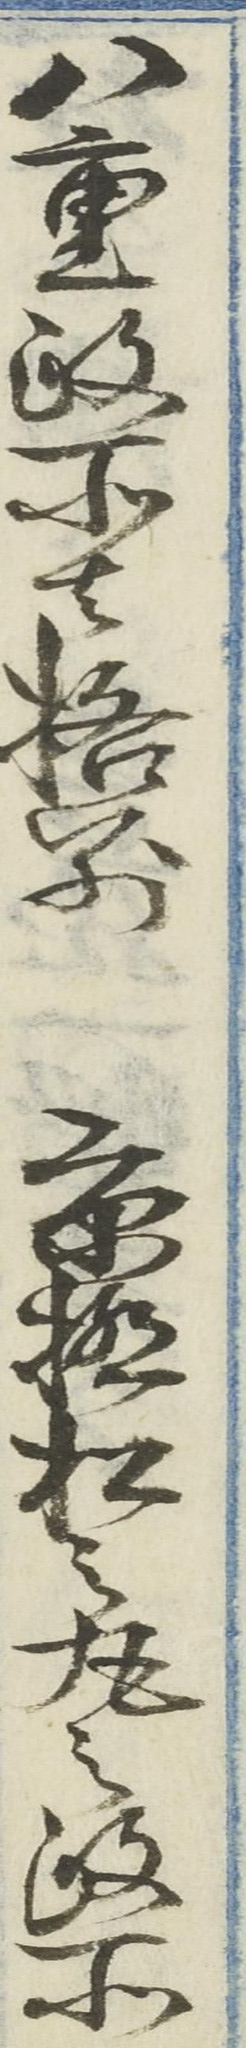八重政所ハ格別京極松之丸之政所
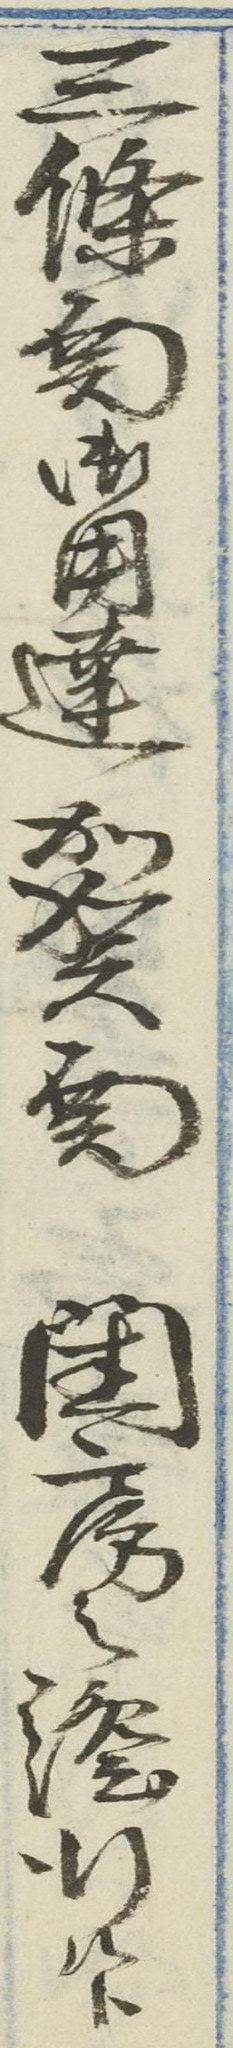三條殿御用達加賀殿閨房之淫行ルト
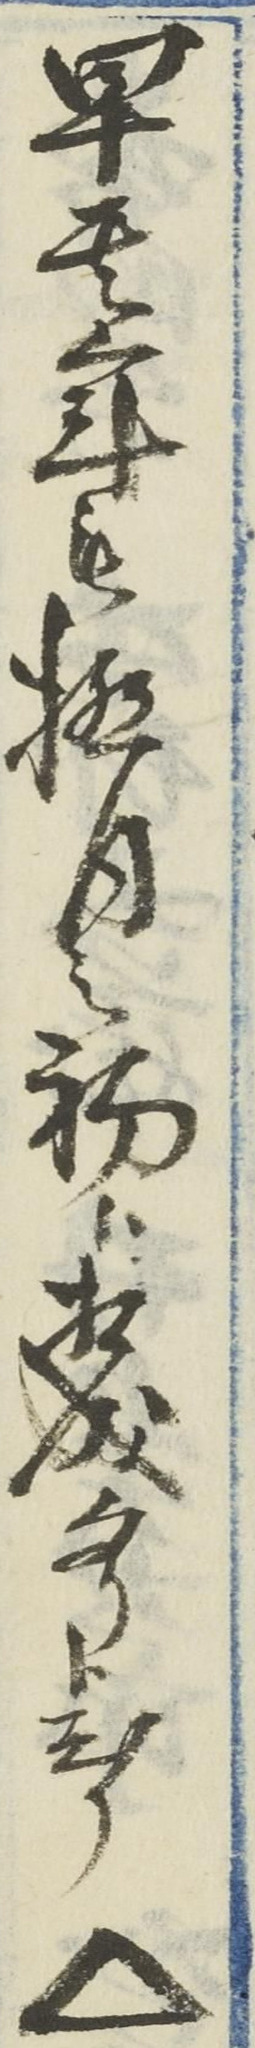早其年モ極月之初ト相成タリト云ウ△
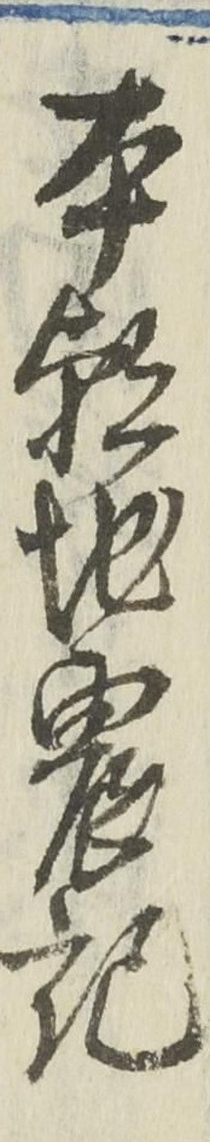本朝地震記
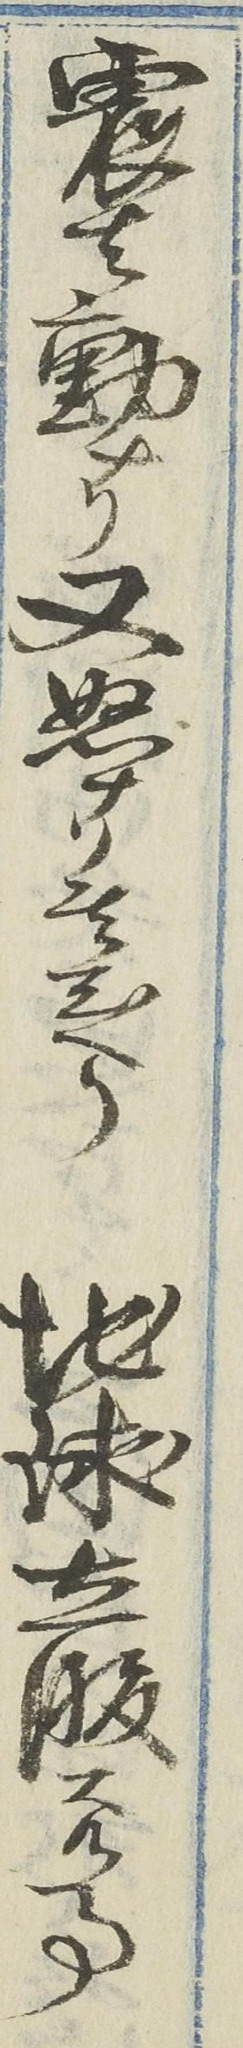震は動ナリ又怒ナリ共云ヘリ地球立腹スル事
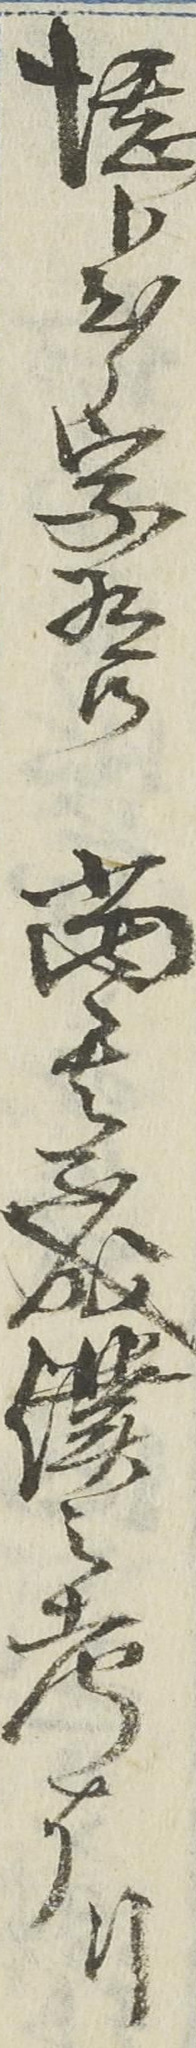湛ト云ウ宗有ル当二ハ不成僕之考ナリ
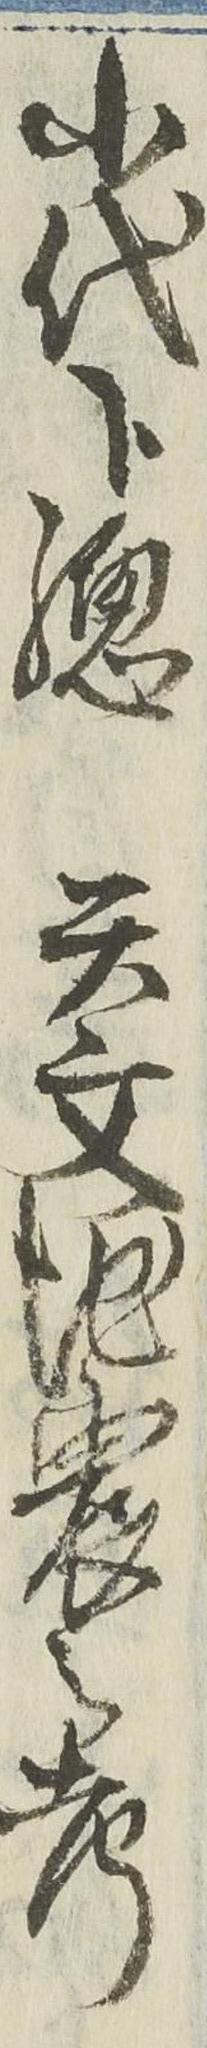小代下総天文地震之考
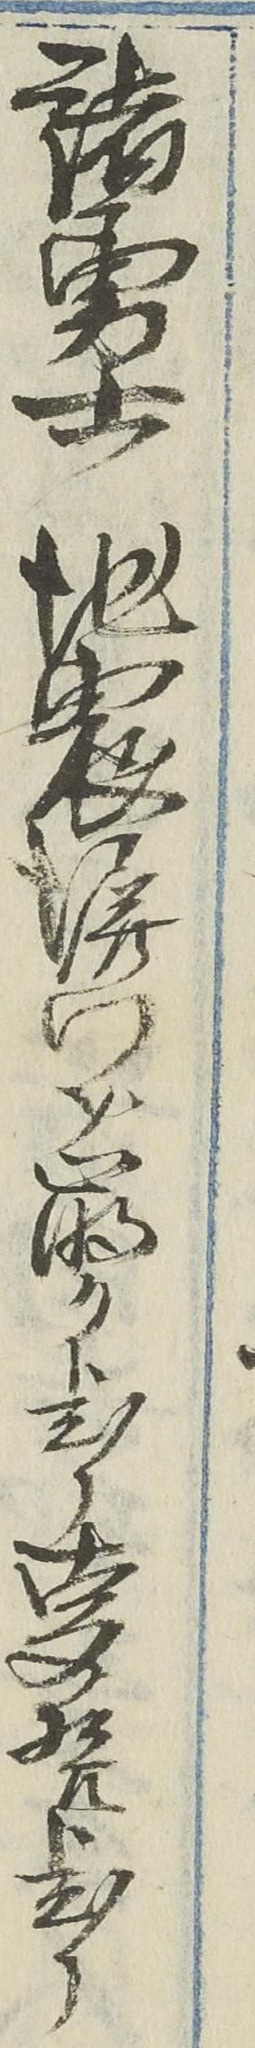諸勇士地震塀門ヲ崩リト云ウ事有ルト云ウ
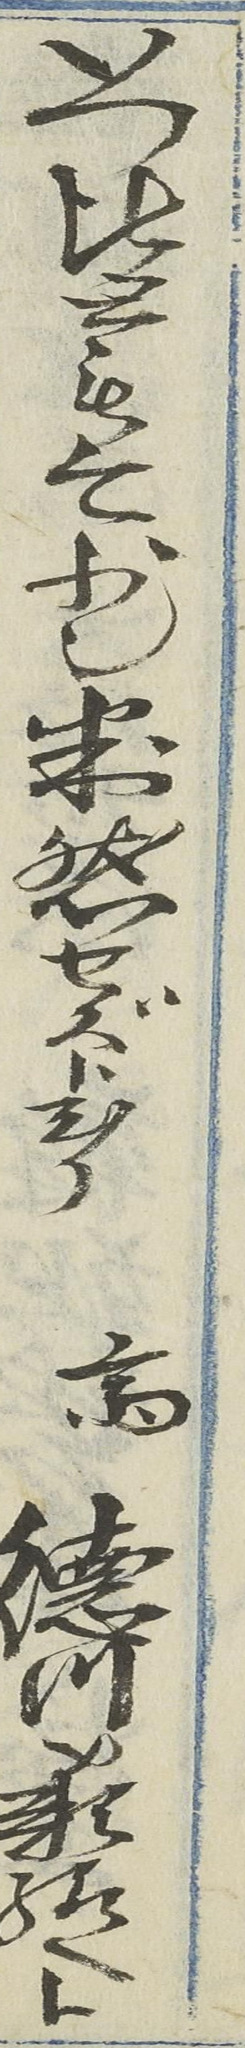いつ比とも今少シ判然セズト云ウ髙徳川ヲ頼給へト
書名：伏水大地震
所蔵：東京大学地震研究所図書室 Earthquake Research Institute Library, The University of Tokyo, JAPAN
